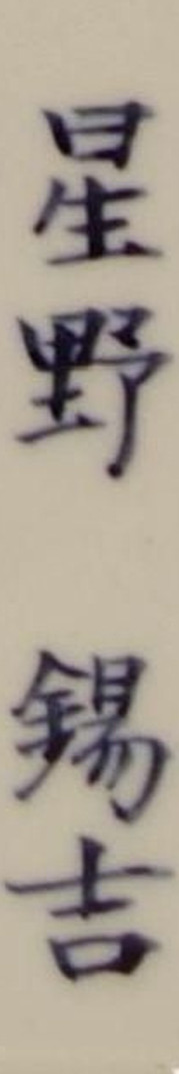星野錫吉
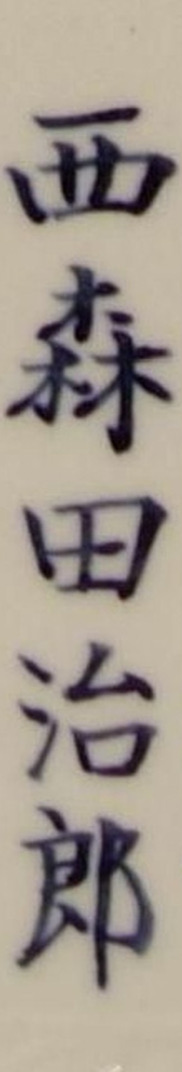西森田治郎
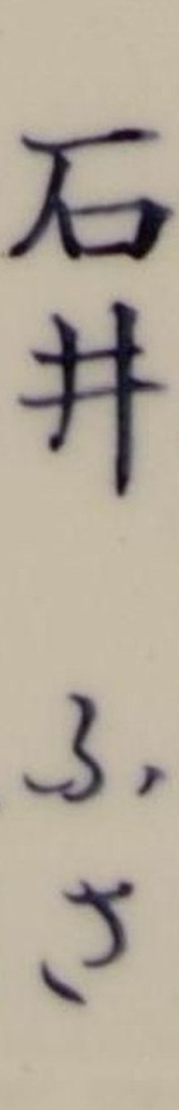石井ふさ
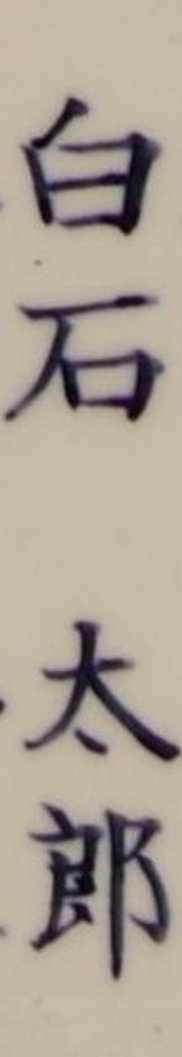白石太郎
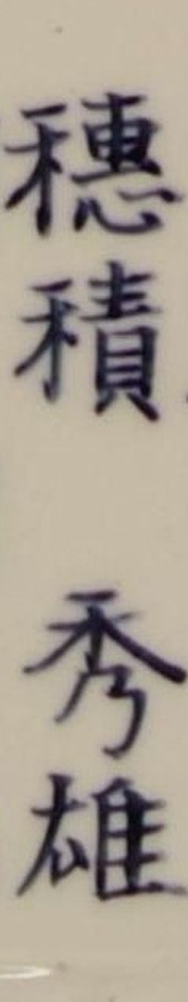穂積秀雄
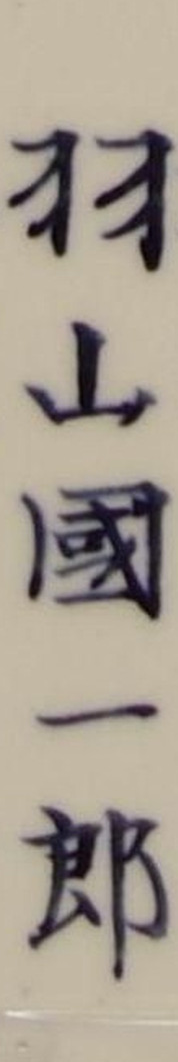羽山國一郎
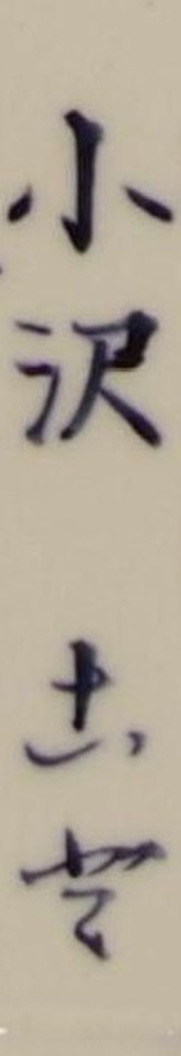小沢こと
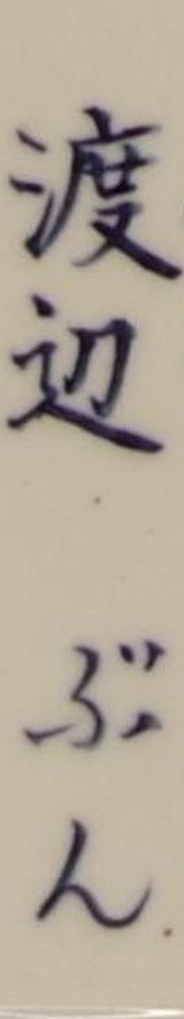渡辺ぶん
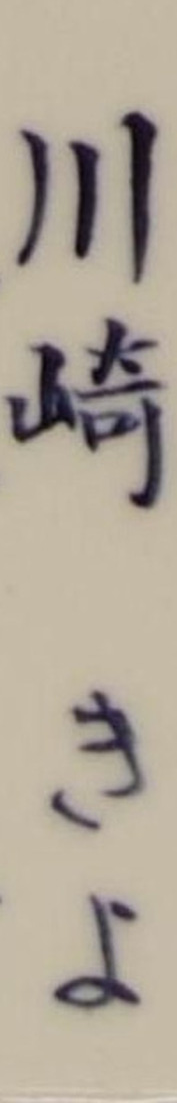川崎きよ
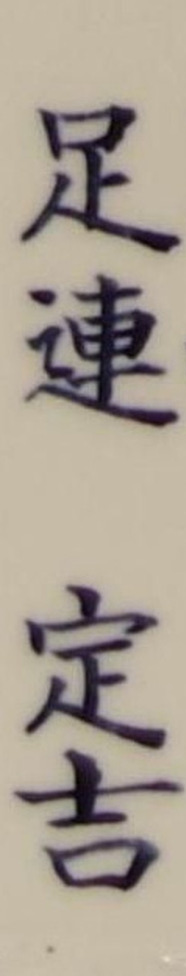足連定吉
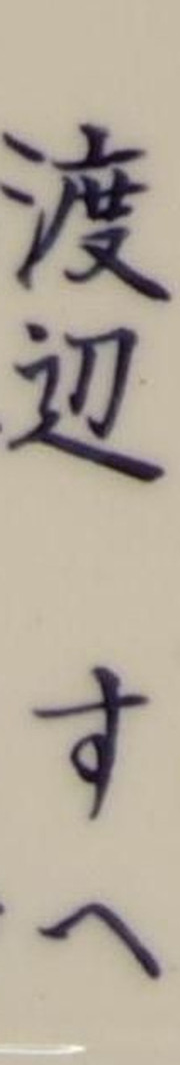渡辺すへ
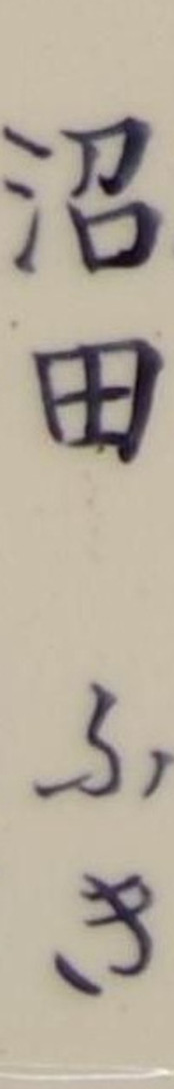沼田ふき
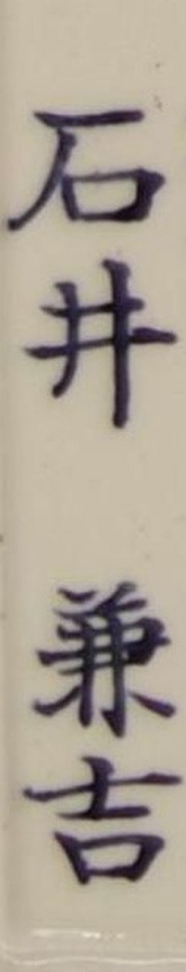石井兼吉

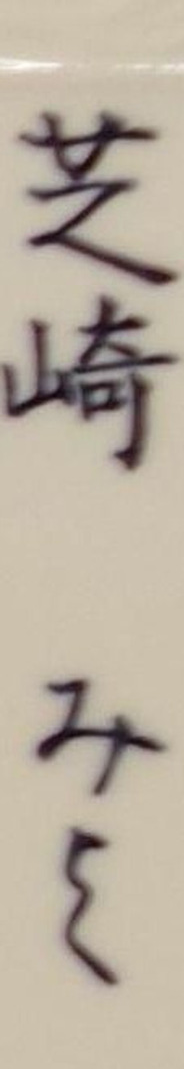芝崎みよ
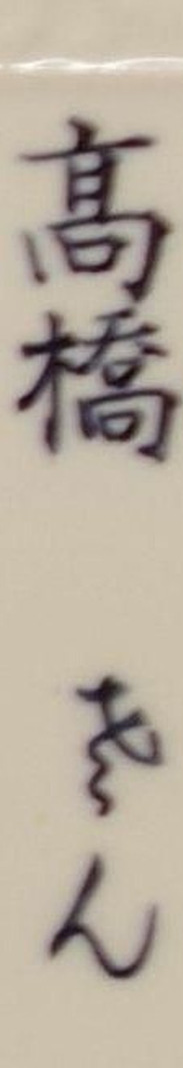高橋さん
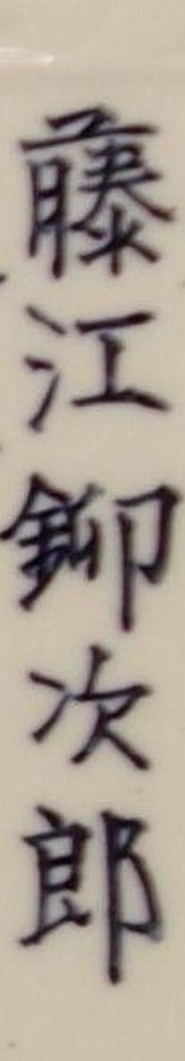藤江鉚次郎
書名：M~S
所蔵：高野山金剛峯寺
